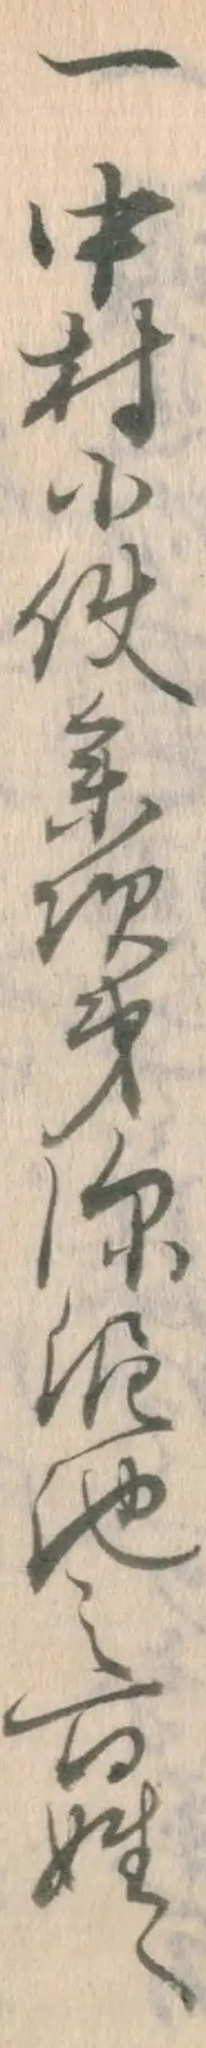一中村小使参次第深泥池之百姓へ
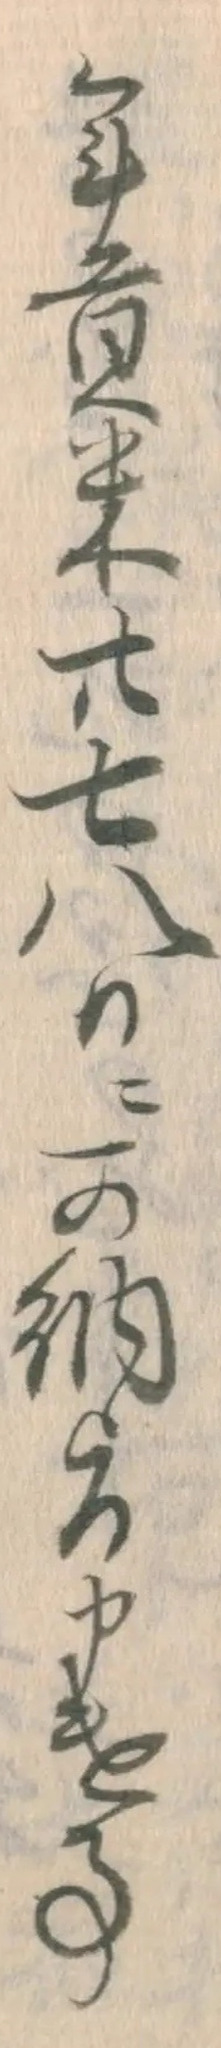年貢米廿七八日に可納旨申遣事
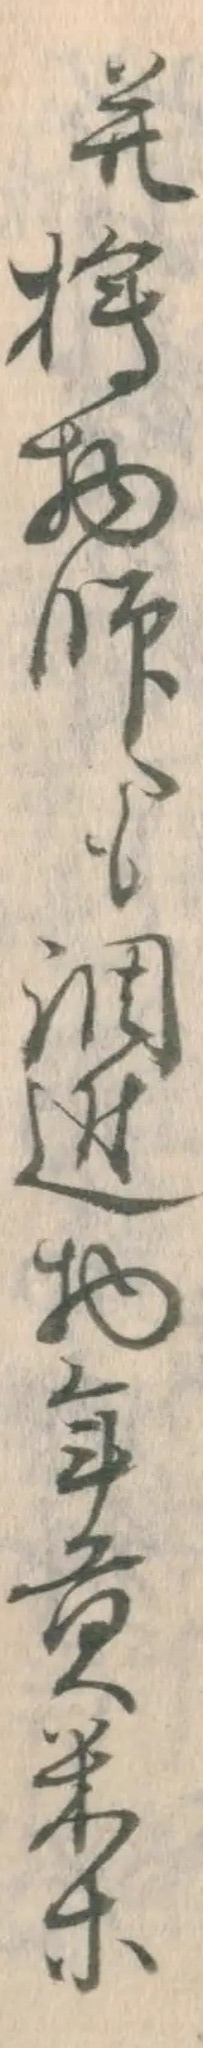并檜物師へも調進物年貢米等
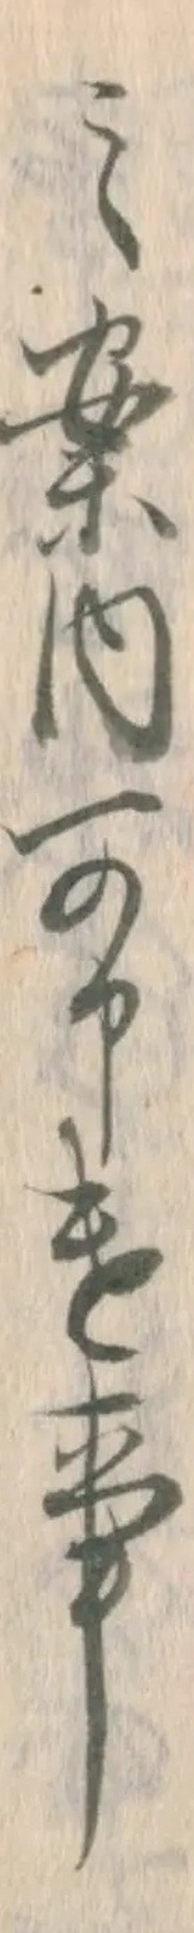之案内可申遣事
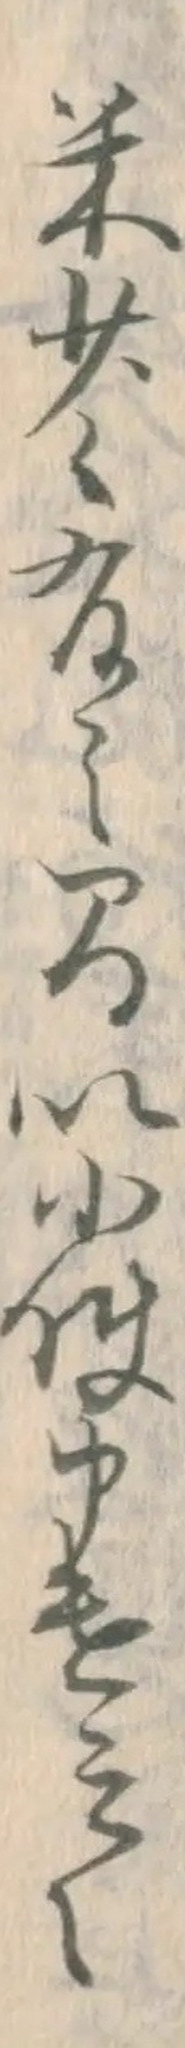米少々有之間以小使申遣之候
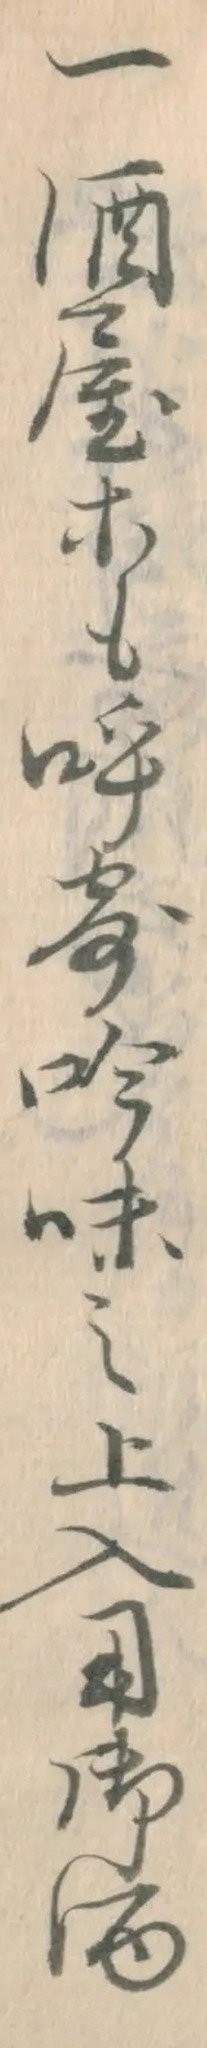一酒屋等も呼寄吟味之上入用御酒

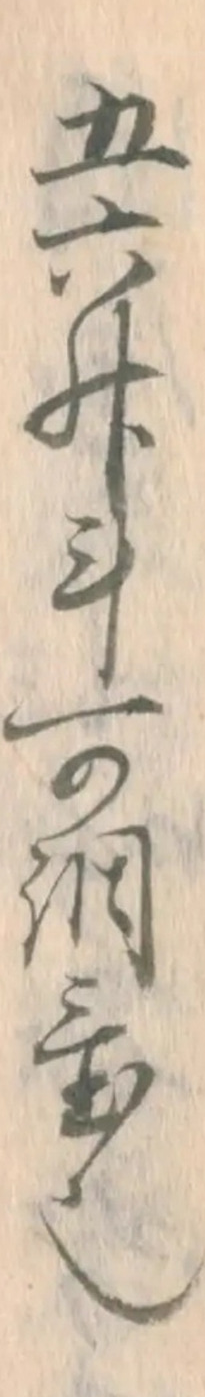五六升斗可調置也
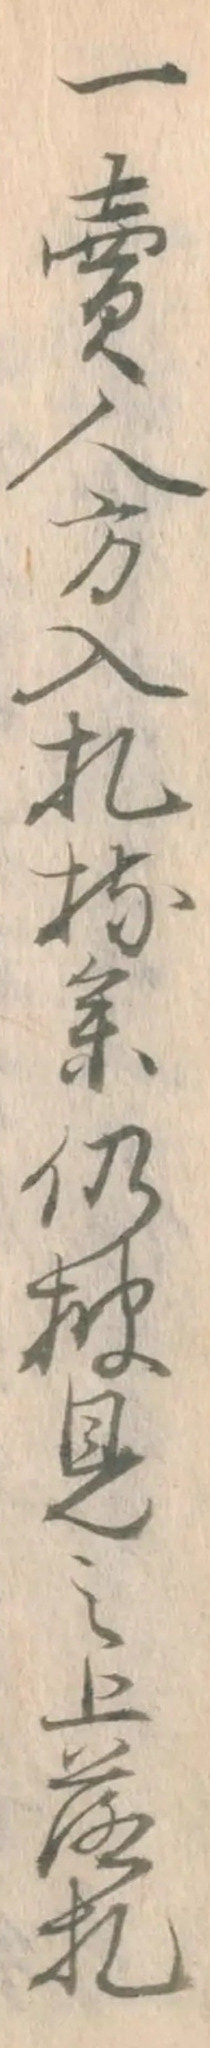一売人方入札持参仍披見之上落札
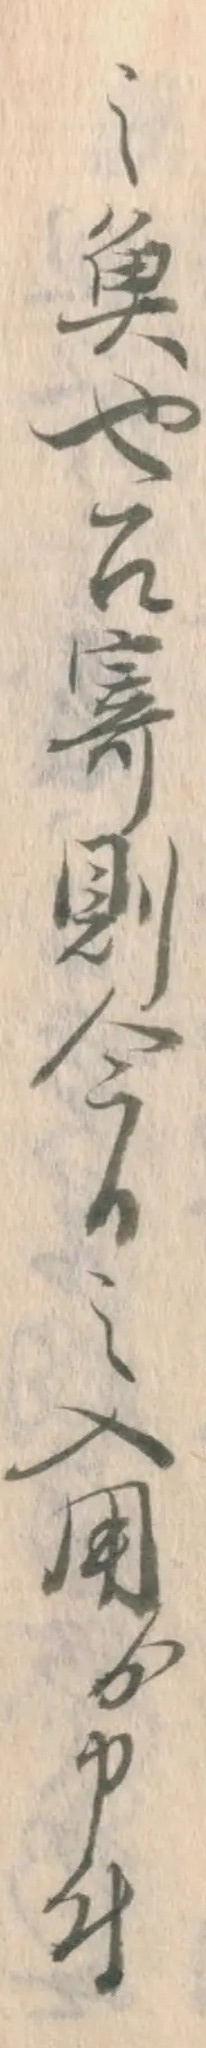之魚や召寄則今日之入用ゟ申付
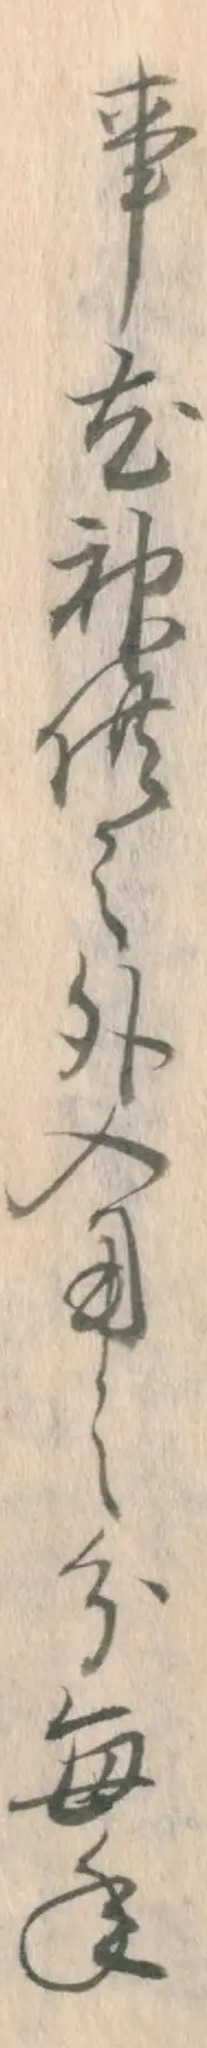事尤神供之外入用之分毎年
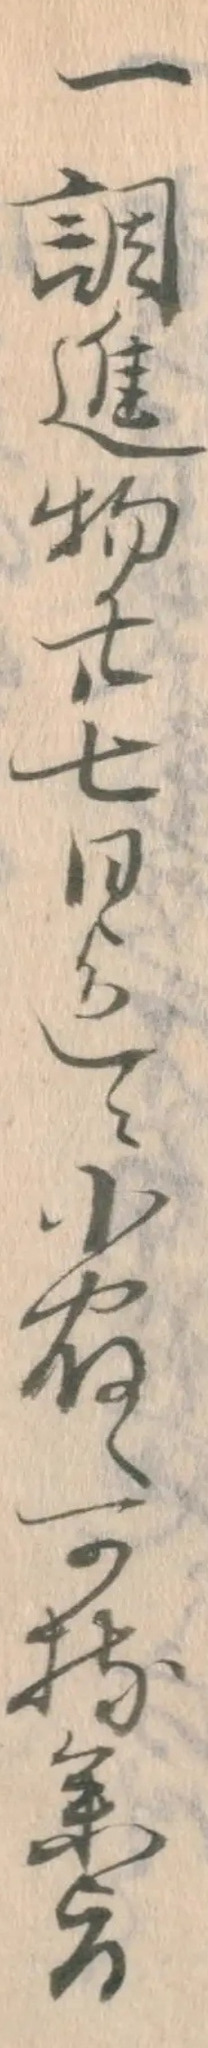一調進物廿七日迄に小宿へ可持参旨
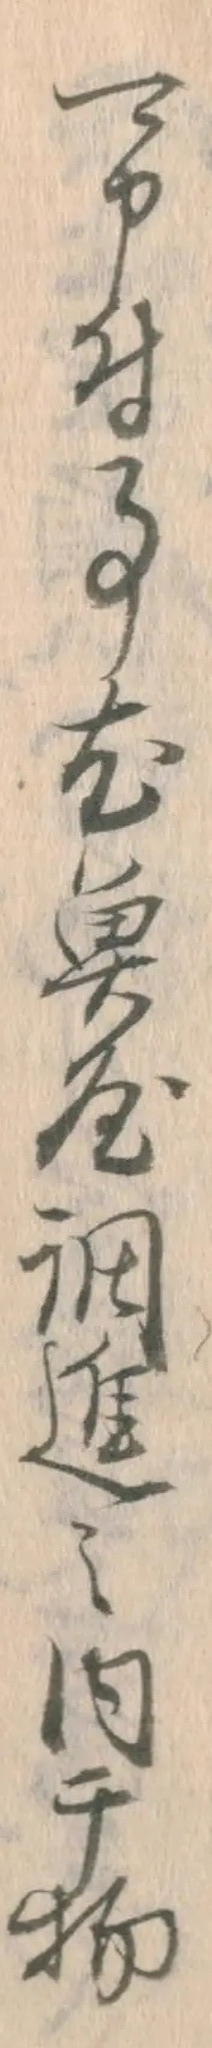可申付事尤魚屋調進之内干物
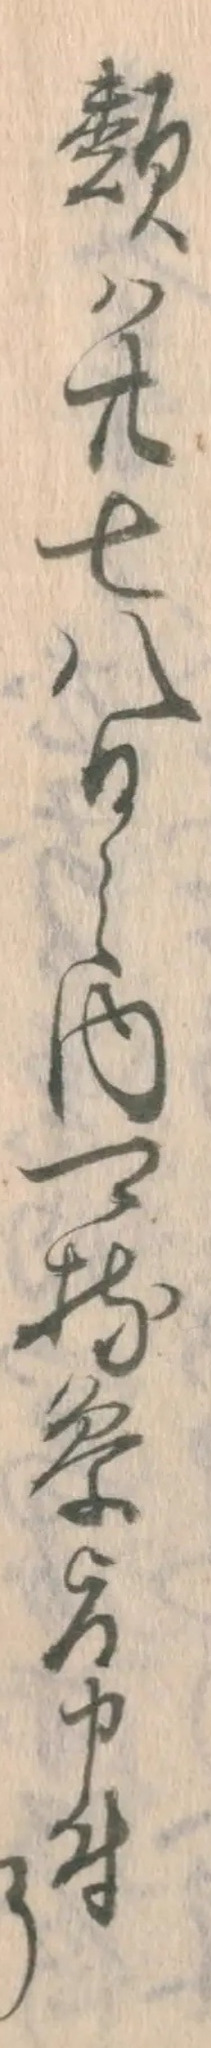類は廿七八日之内可持参旨申付了
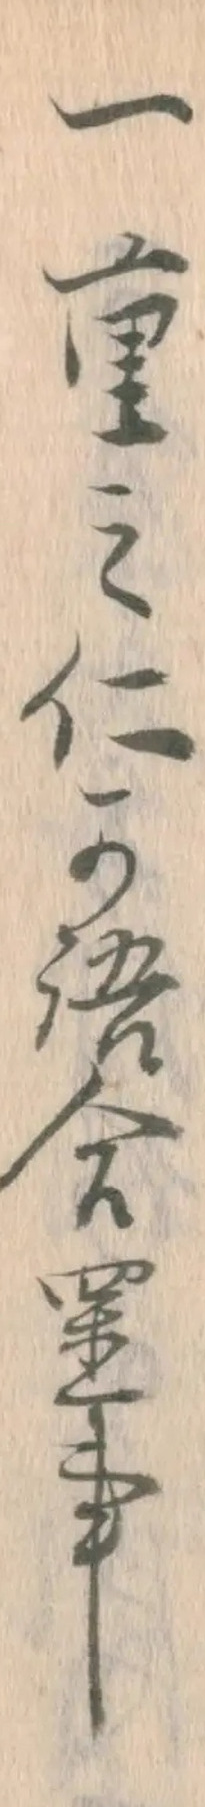一重之仁可語合置事
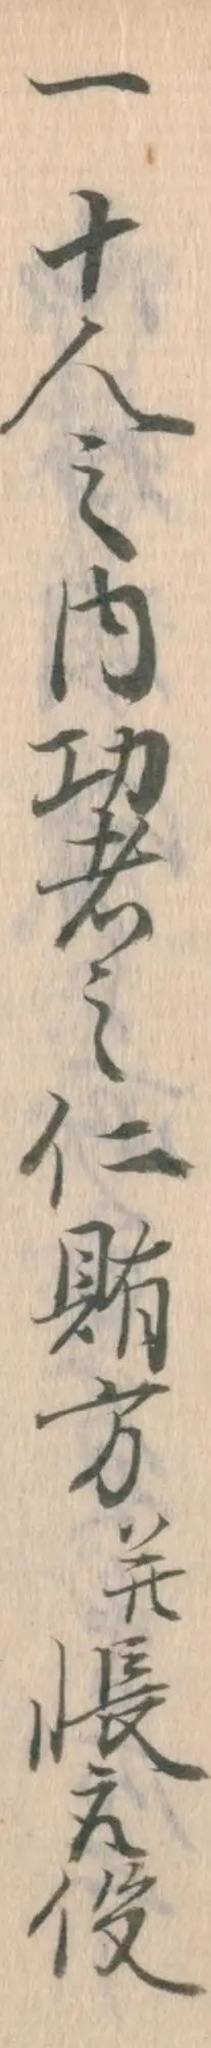一十人之内功者之仁賄方并帳取役
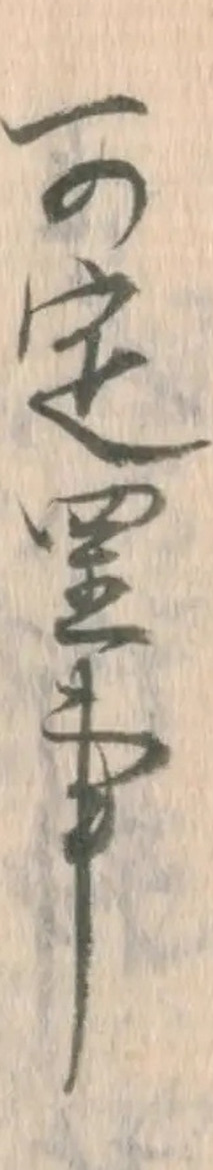可定置事
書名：賀茂社記録. 第81冊
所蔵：国立国会図書館 National Diet Library, JAPAN
